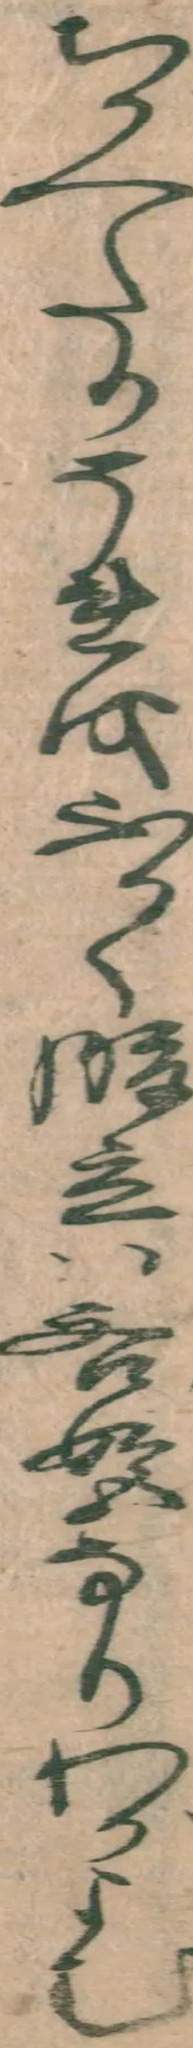ちがへたりそれをふかく腹立は悋姫なりわかよむ
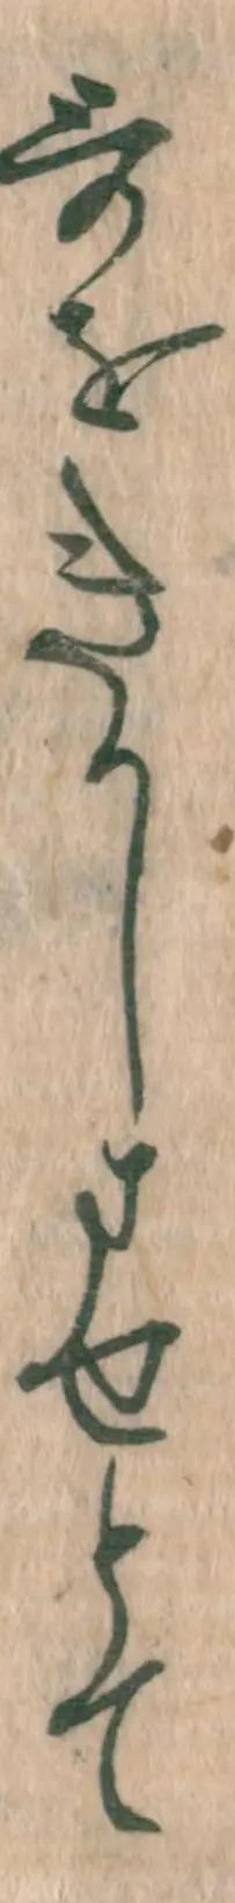哥をきかしませとて
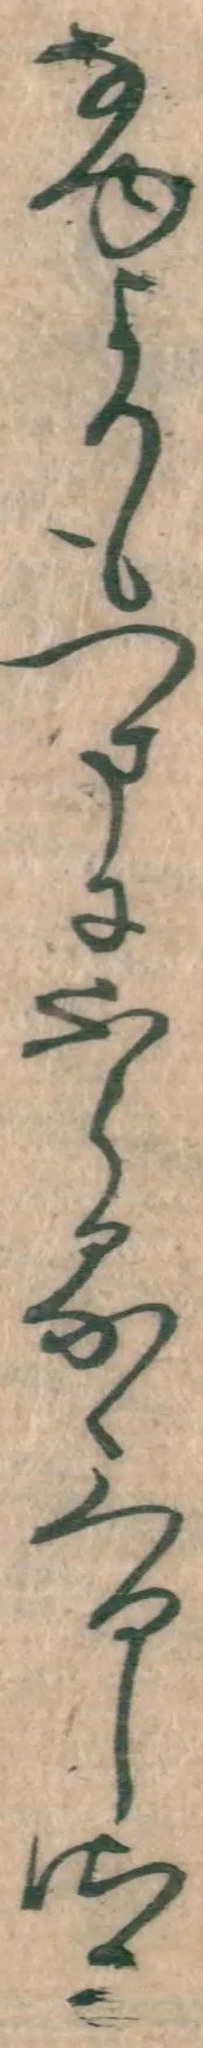なゆよりもつまにふらるゝくるしさ
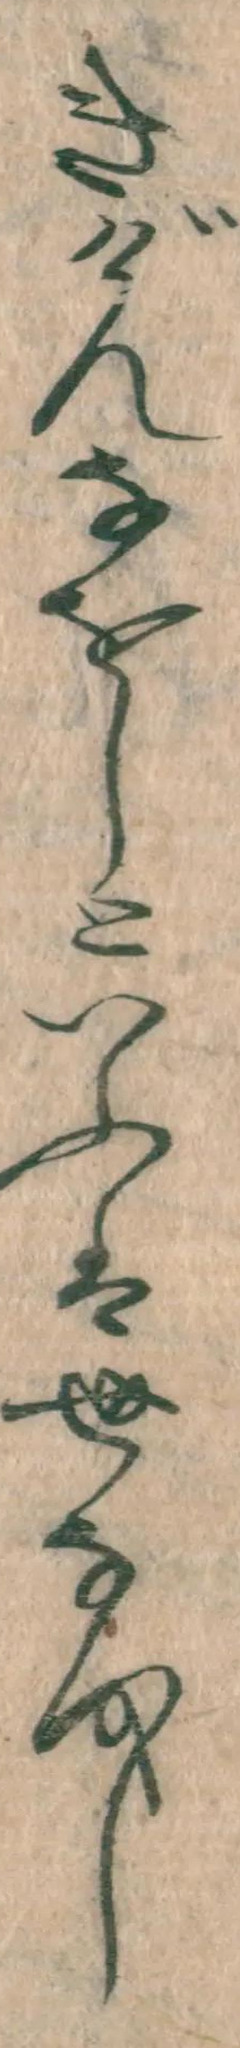きげんなをしといふは世なをし
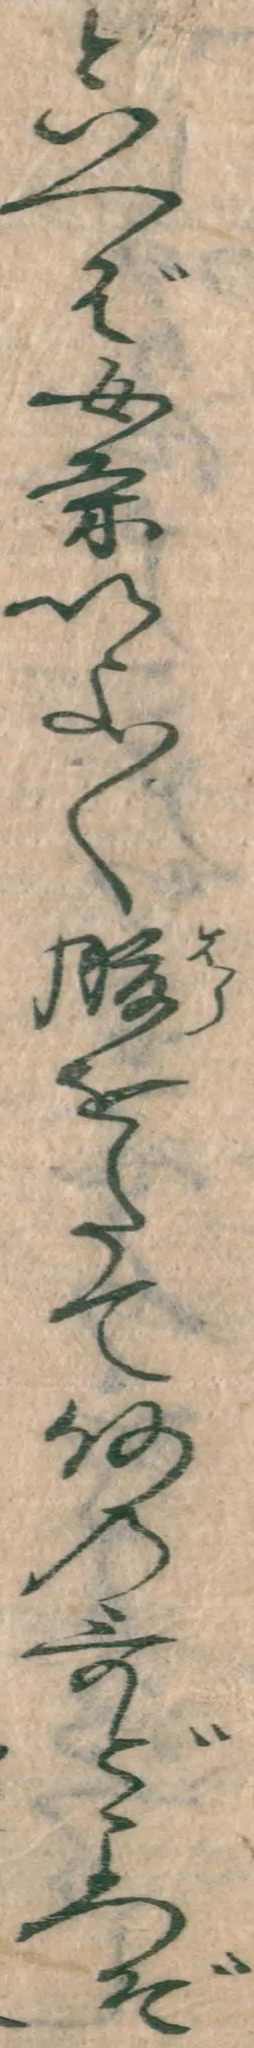といへば女房いよ〳〵腹をたて何の哥どころぞ
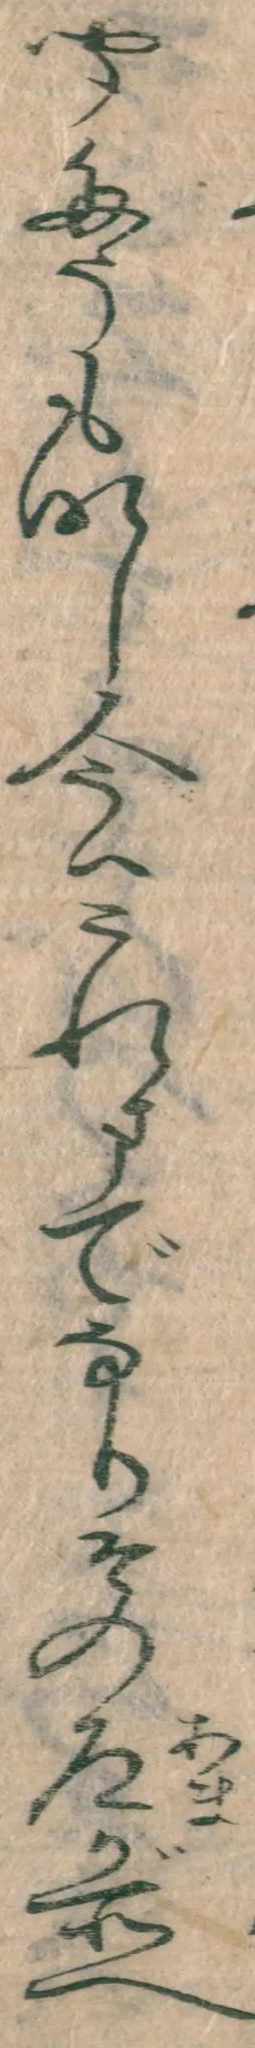聞たうもなし今はこれまでなりその尼が所へ
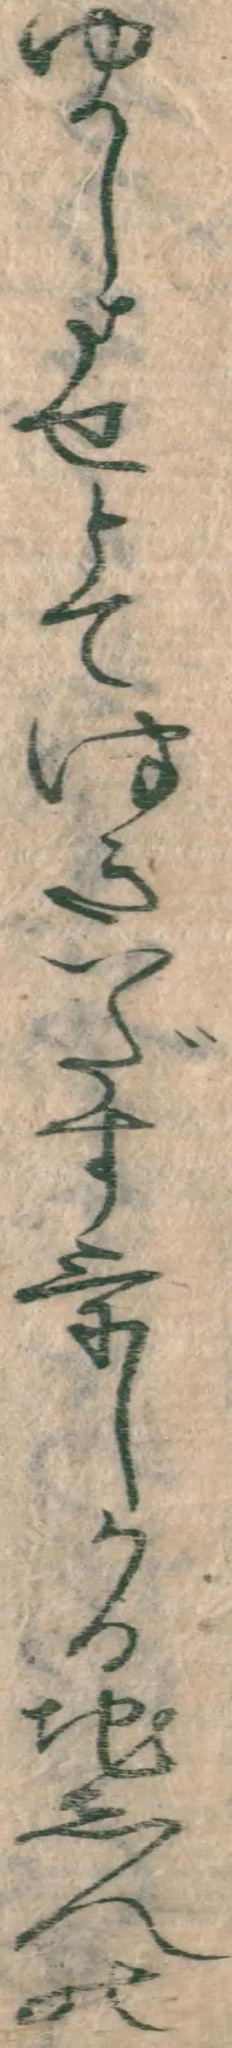ゆかしませとてつきいだすけしかる地しんの
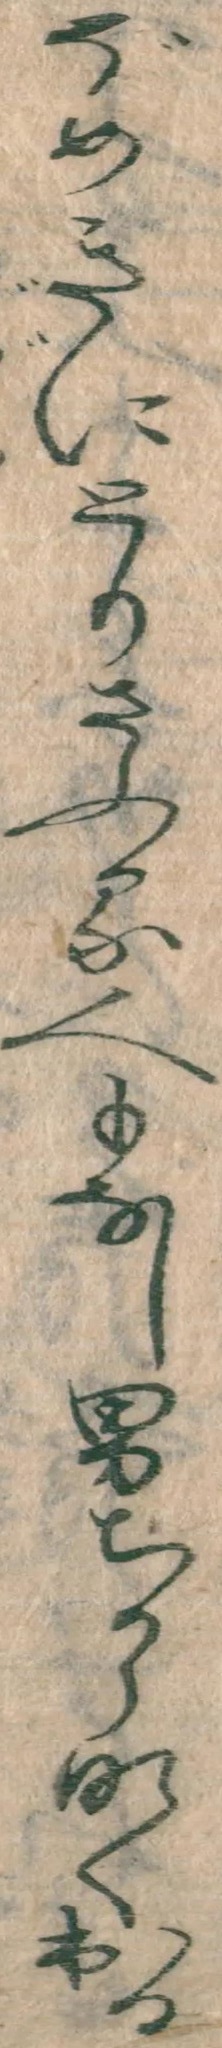うめきにとりさふる人もなし男ちからなく出る
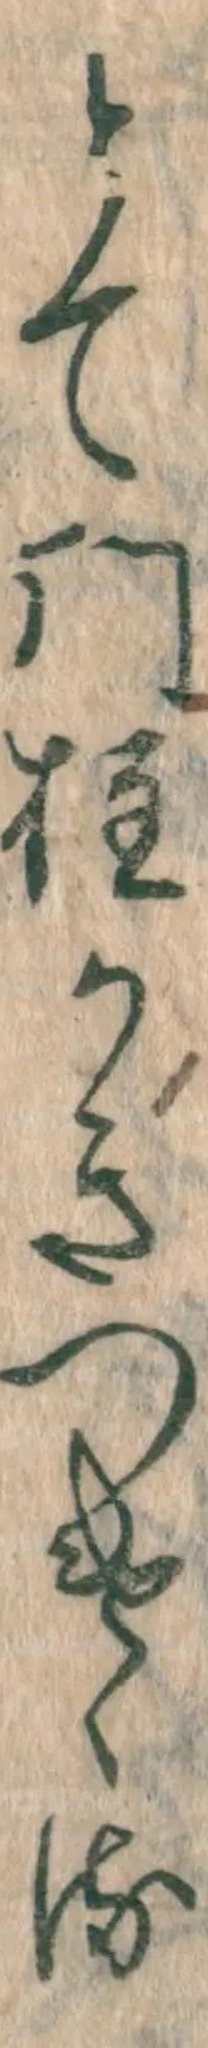とて門柱かきつけゝる
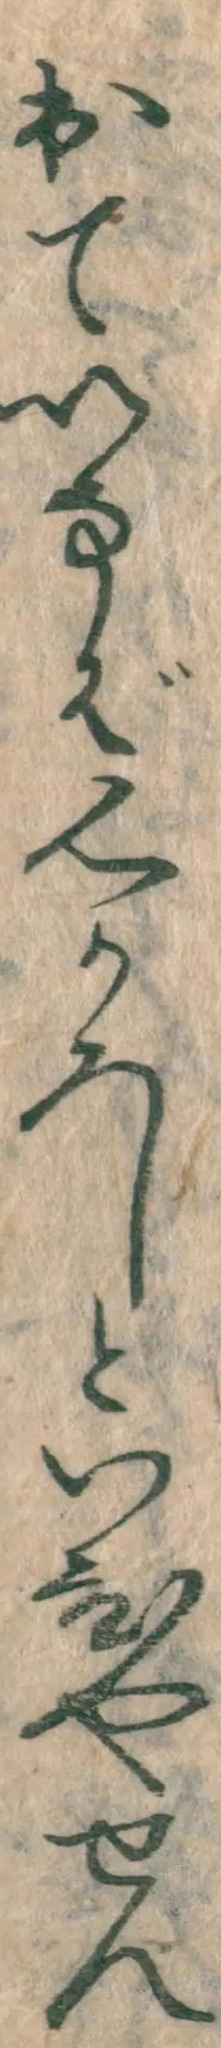でていなば心かろしといひやせん
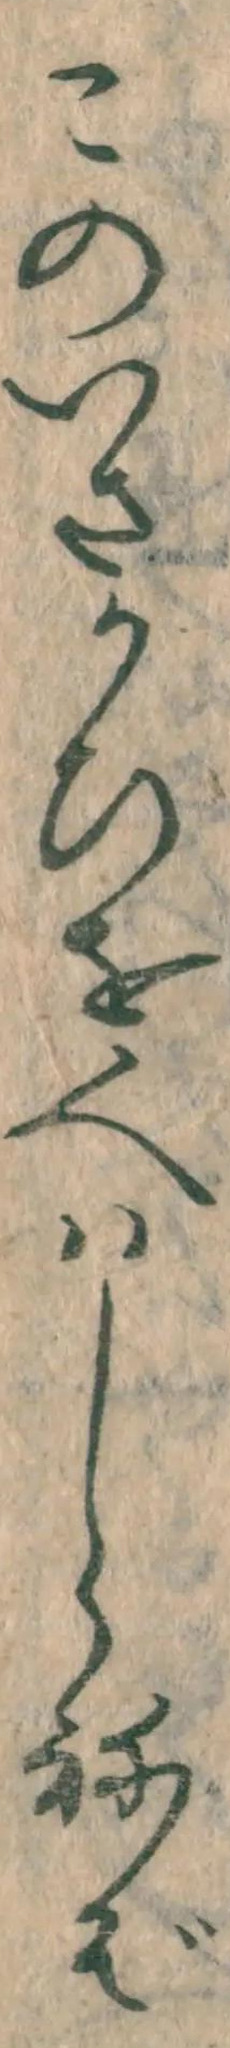このいさかひを人はしらねば

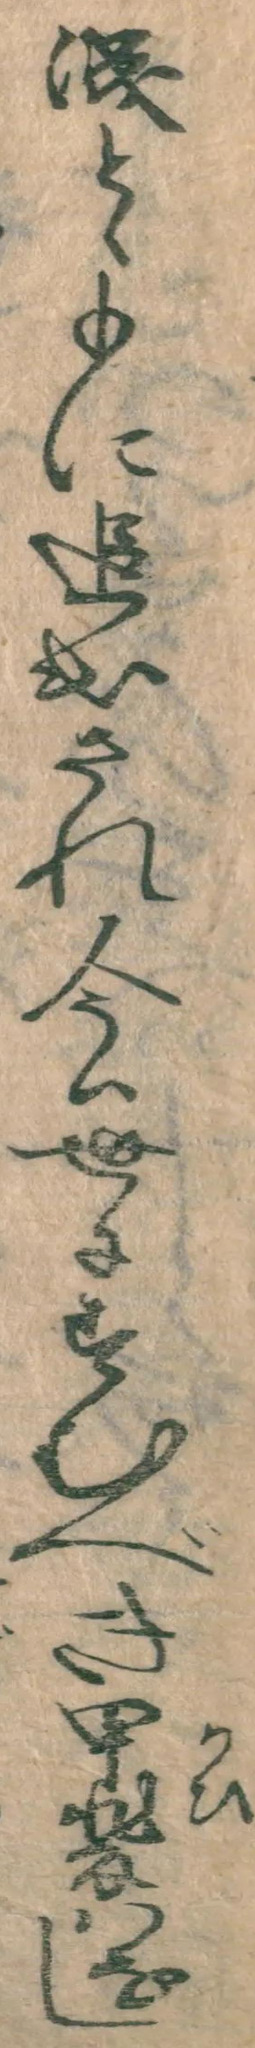洟とゝもに追出され今は世にすむべき甲斐はなし
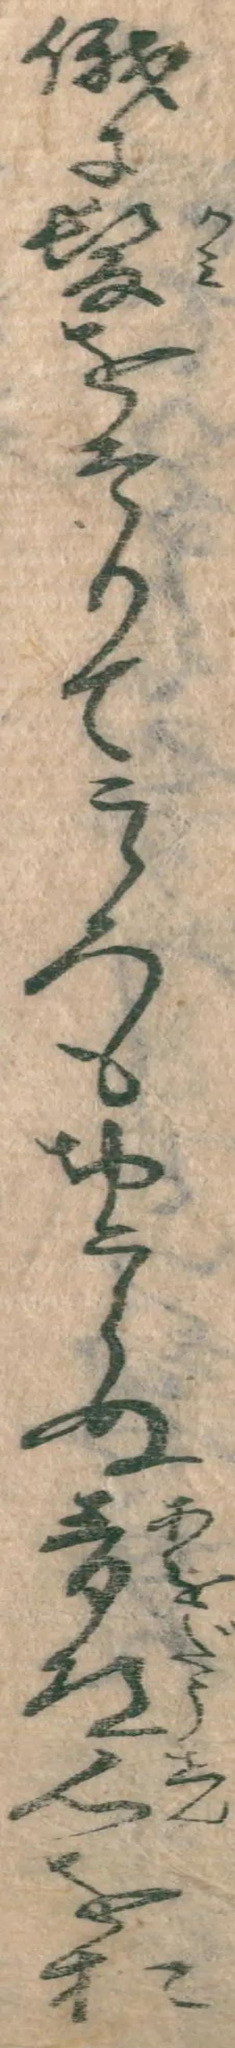俄に髪をそりてこゝろもおとしぬ青道心をお
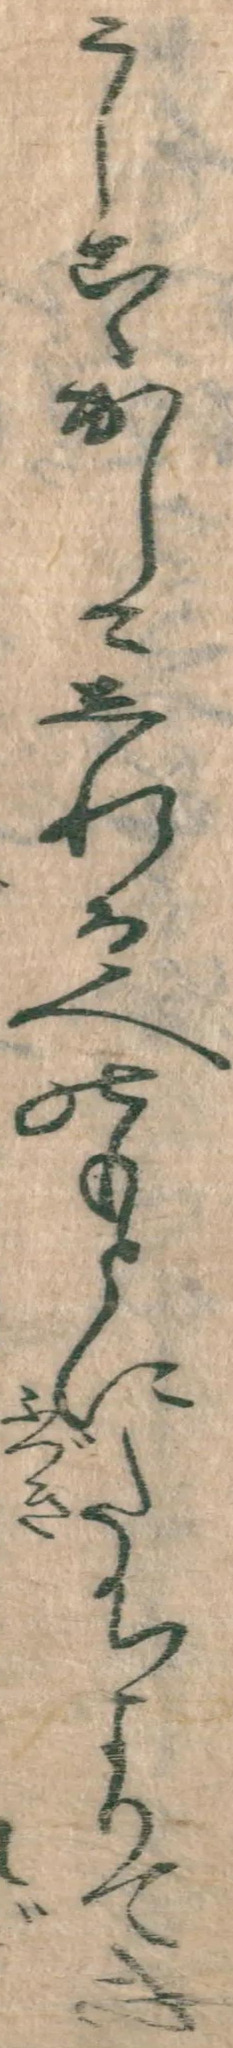こしこゝかしこしれる人のもとにたちよりてき
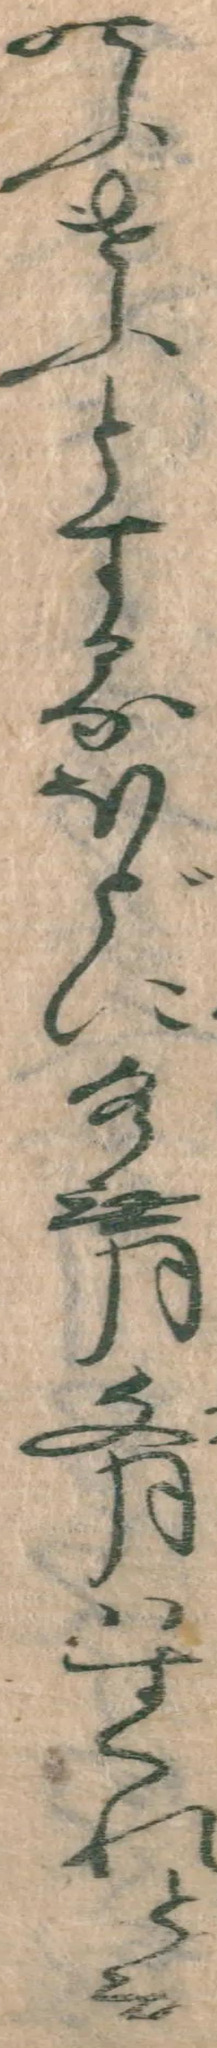のふけふとするほどに水無月文月はすくれども
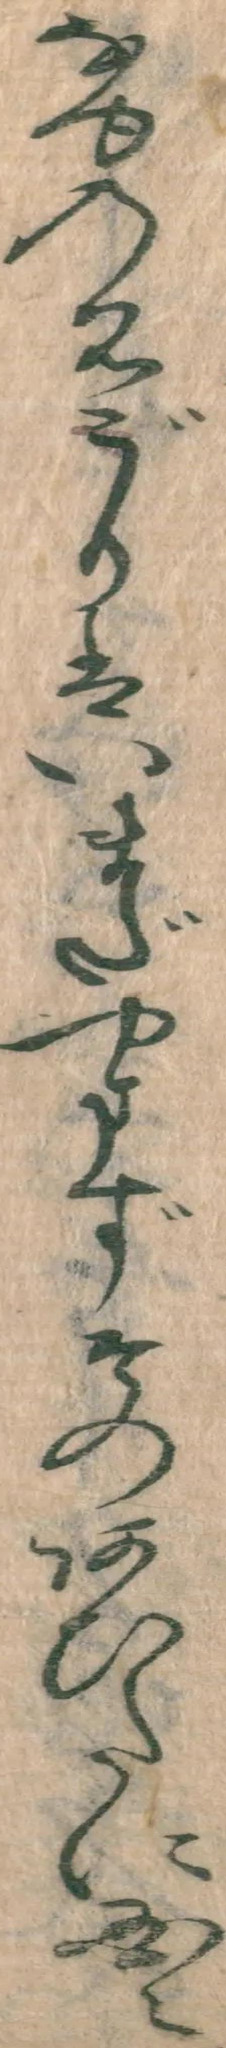なゆの名ごりはいまだやまずそのあひたに国々
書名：艱難目異志. 上,下
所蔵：国立国会図書館 National Diet Library, JAPAN
